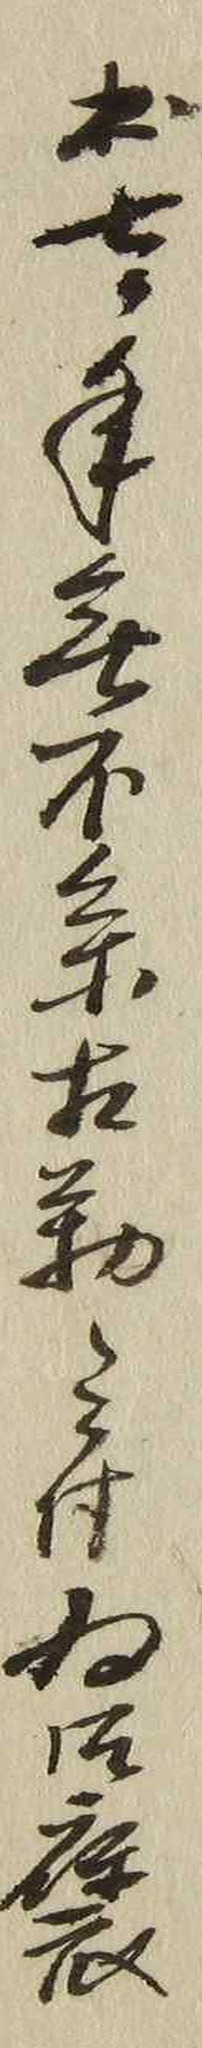出七ケ年無不参相勤候ニ付為御褒
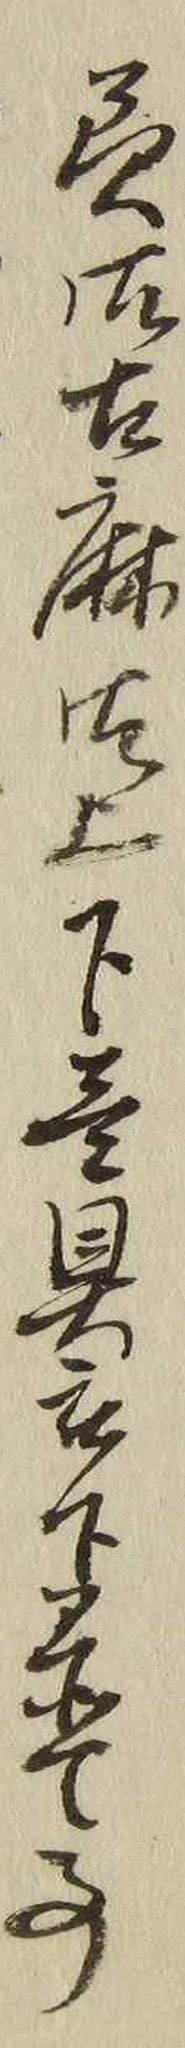美御古麻御上下壱具被下置候事
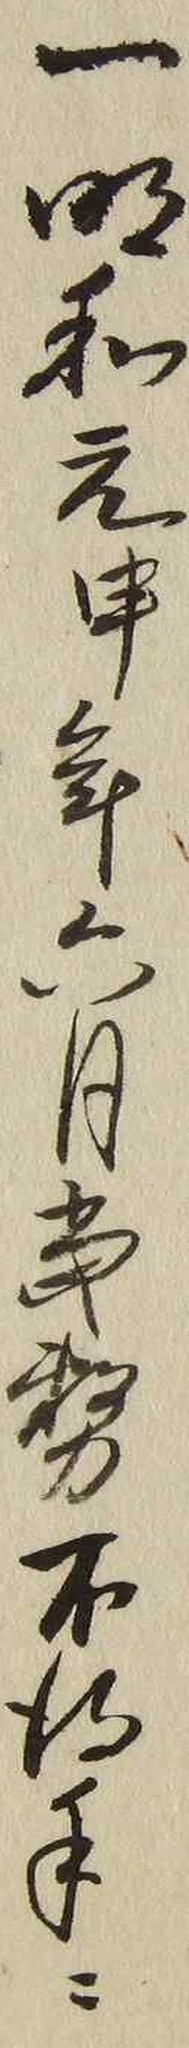一明和元申年六月当務不得手ニ
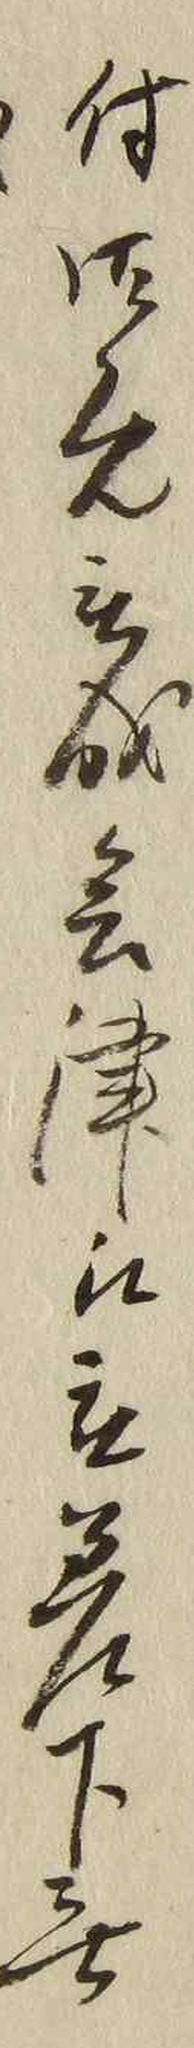付御免被成会津江被差下無
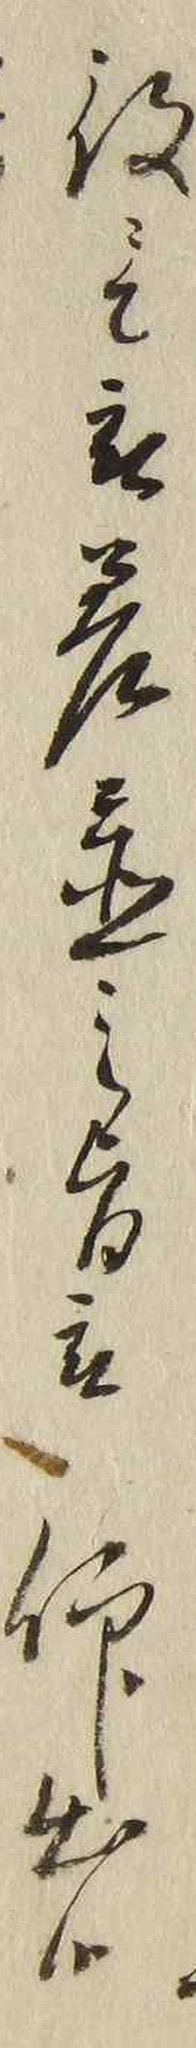役ニて被差置之旨被仰出候

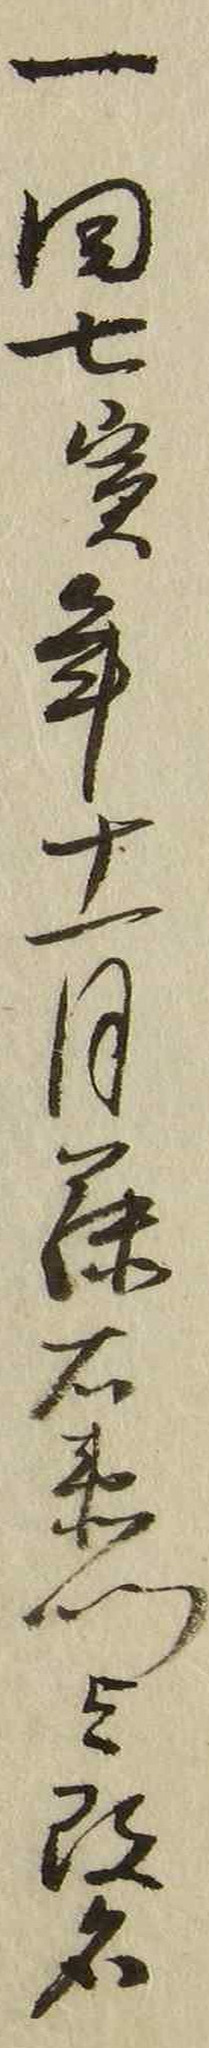一同七寅年十一月藤右衛門与改名
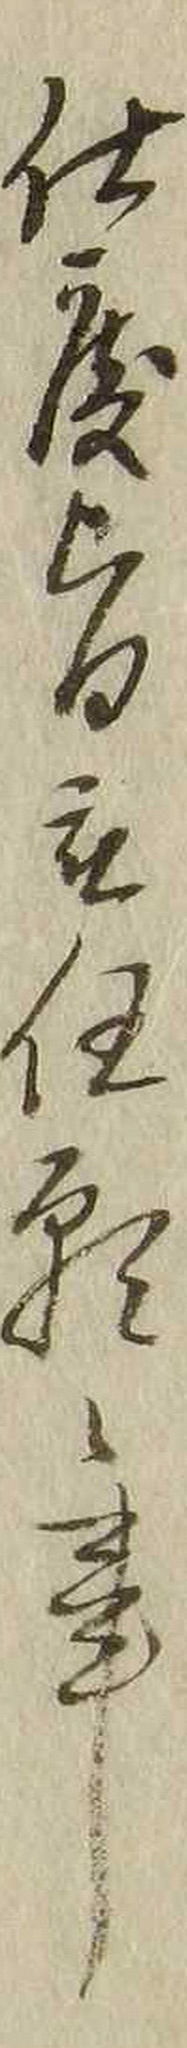仕度旨被任願候事
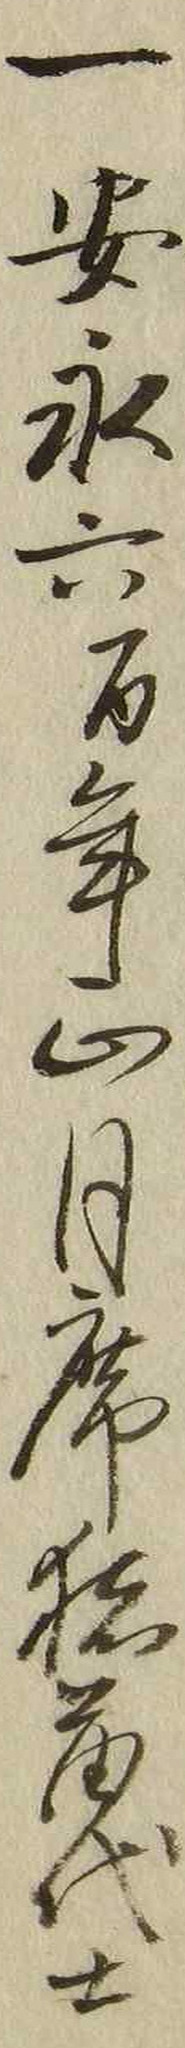一安永六酉年正月席猪苗代士
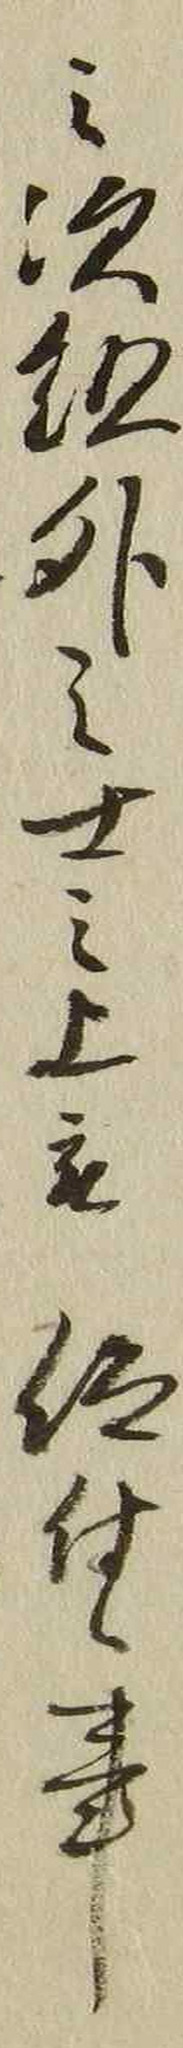之次組外之士之上被仰付候事
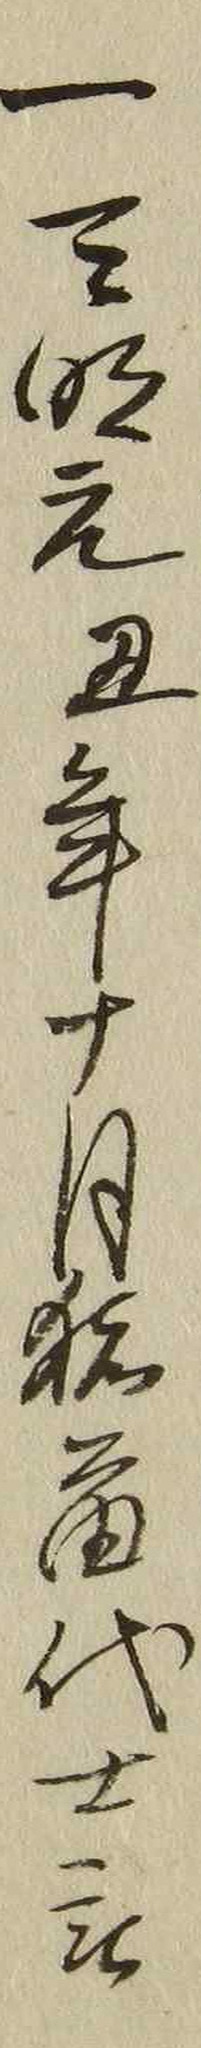一天明元丑年十月猪苗代士被
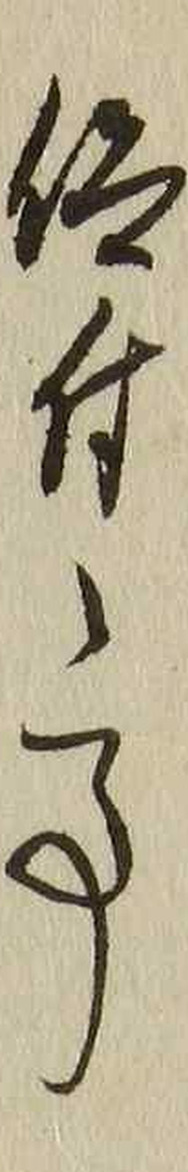仰付候事
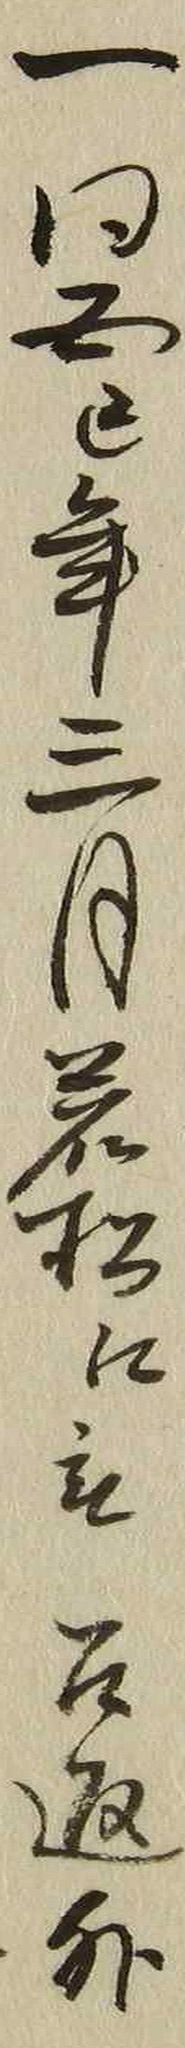一同五巳年三月若松江被召返外
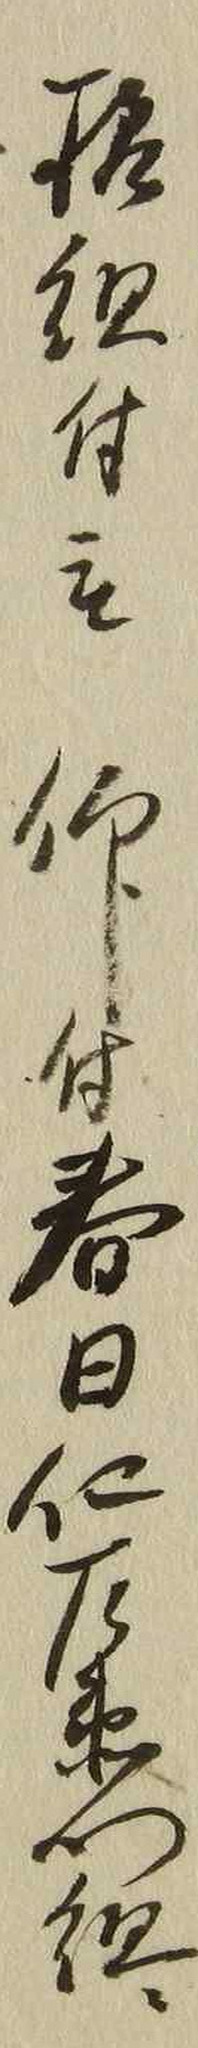様組付被仰付春日仁左衛門組ニ
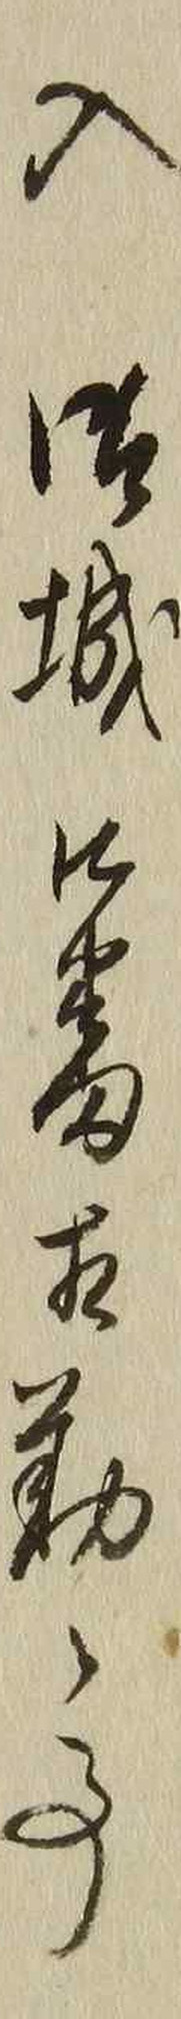入御城御番相勤候事
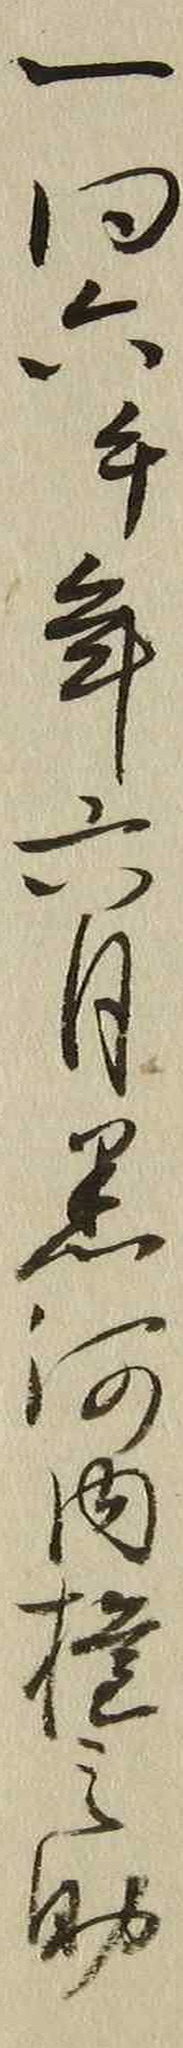一同六午年六月黒河内権之助
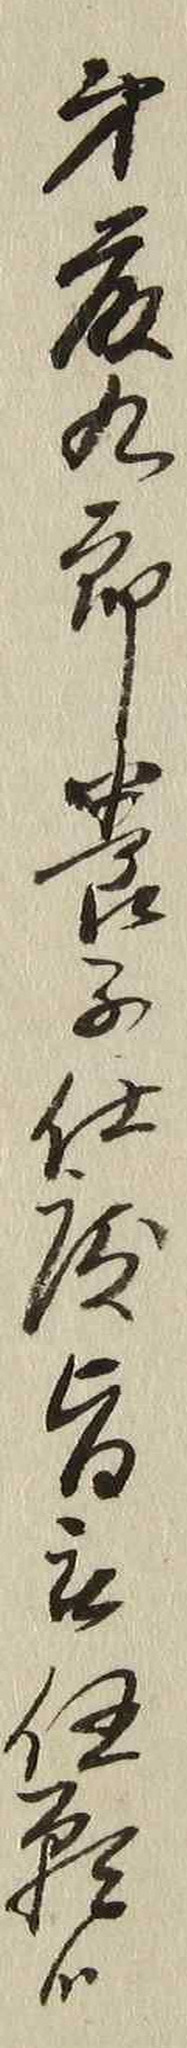弟藤九郎養子仕度旨被任願候
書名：諸士系譜　巻之359　す之部9
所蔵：会津若松市立会津図書館
